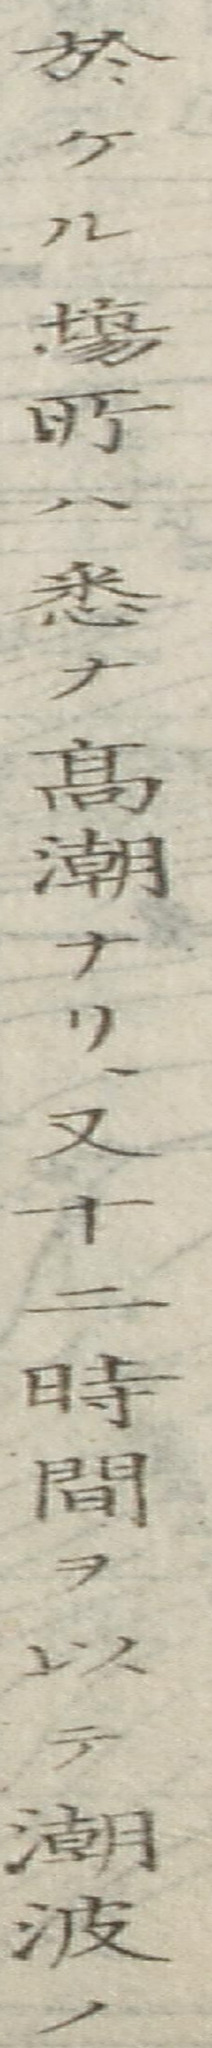於ケル場所ハ悉ナ高潮ナリ、又十二時間ヲ以テ潮波ノ
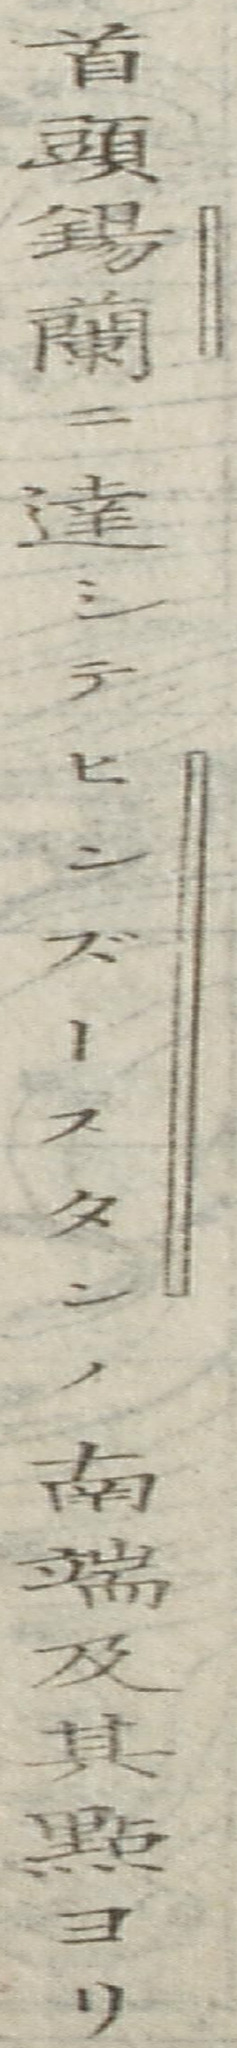首頭錫蘭ニ達シテヒンズースタンノ南端及其点ヨリ
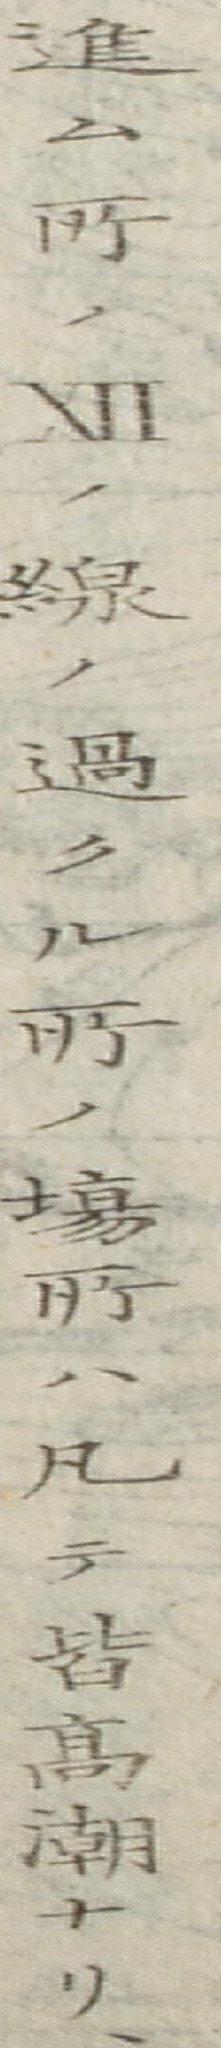進ム所ノⅫノ線ノ過クル所ノ場所ハ凡テ皆高潮ナリ、
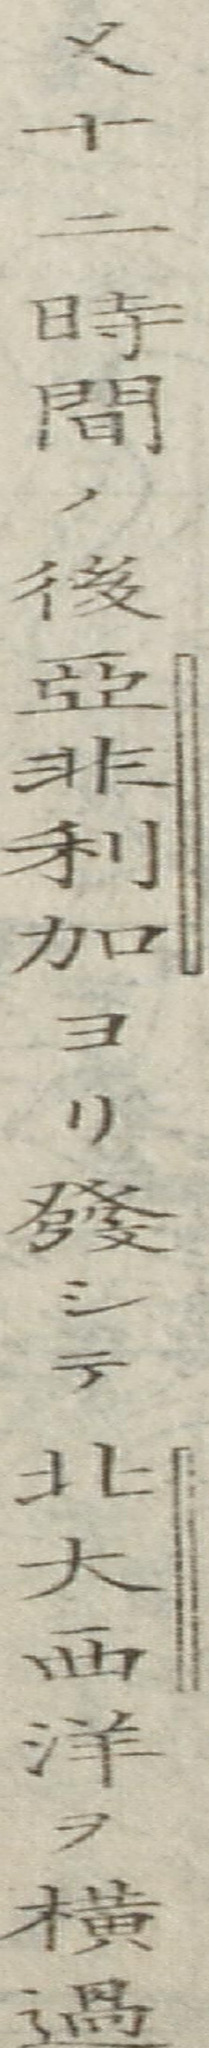又十二時間ノ後亜非利加ヨリ発シテ北大西洋ヲ横過
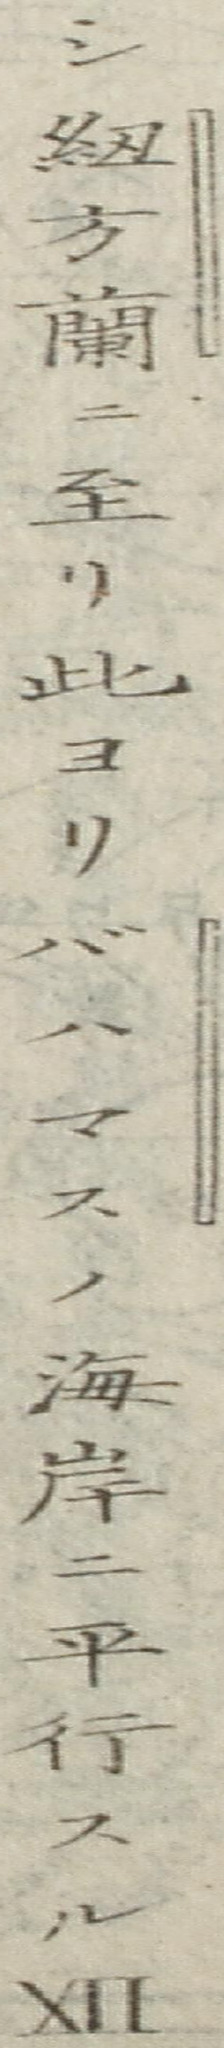シ紐方蘭ニ至リ此ヨリバハマスノ海岸ニ平行スルⅫ
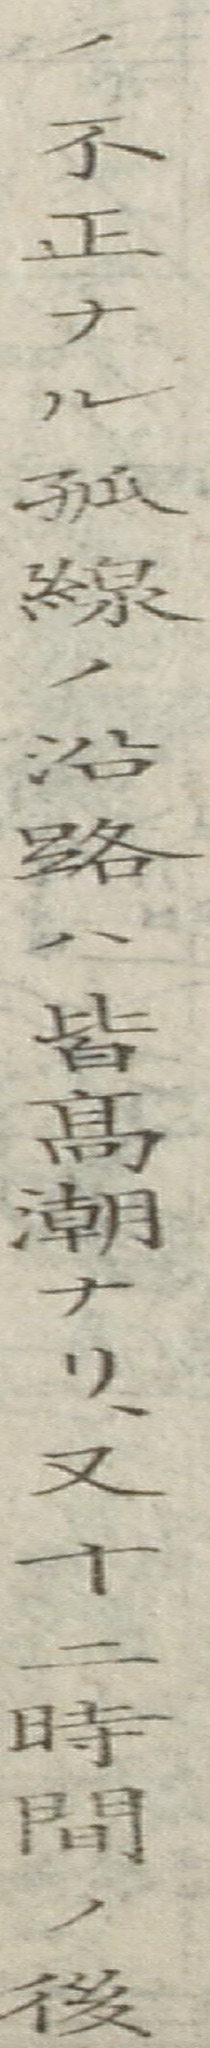ノ不正ナル弧線ノ沿路ハ皆高潮ナリ、又十二時間ノ後
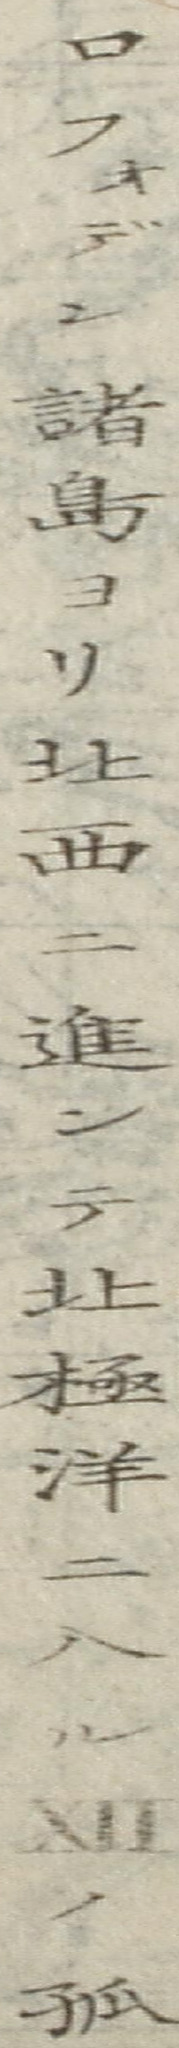ロフォデン諸島ヨリ北西ニ進ンテ北極洋ニ入ルⅫノ弧
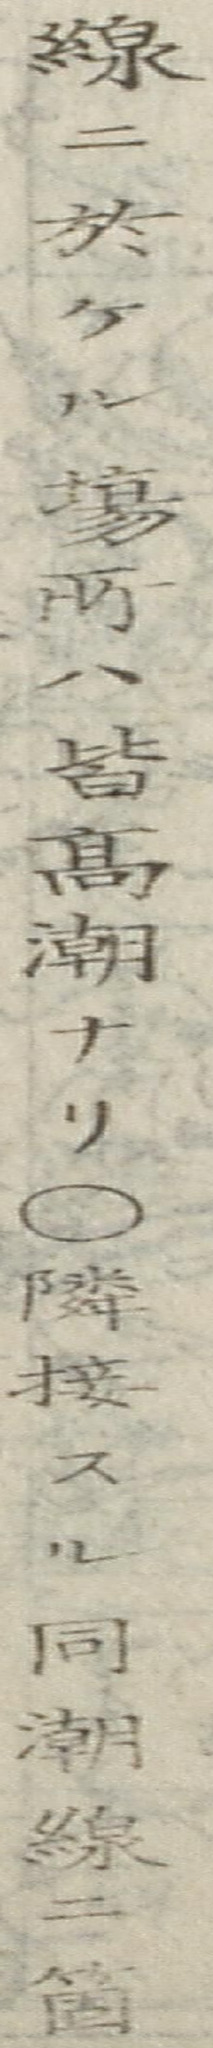線ニ於ケル場所ハ皆高潮ナリ○隣接スル同潮線ニ箇
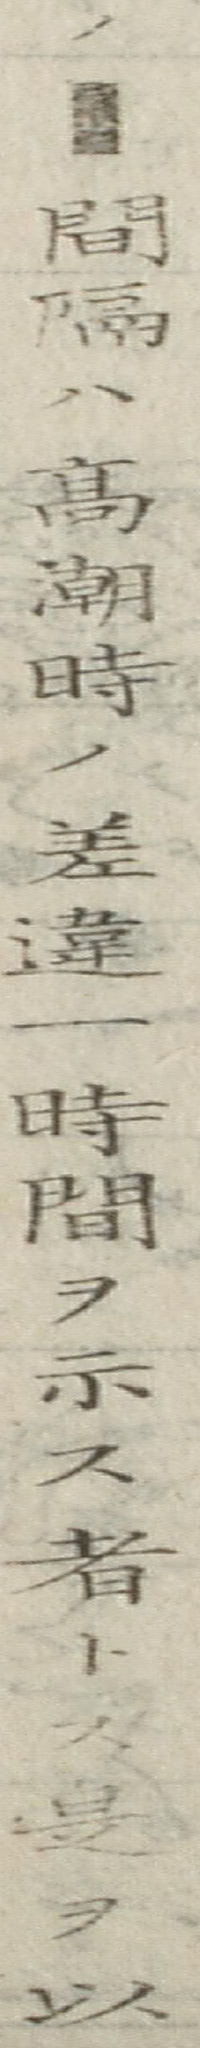ノ間隔ハ高潮時ノ差違一時間ヲ示ス者トス是ヲ以
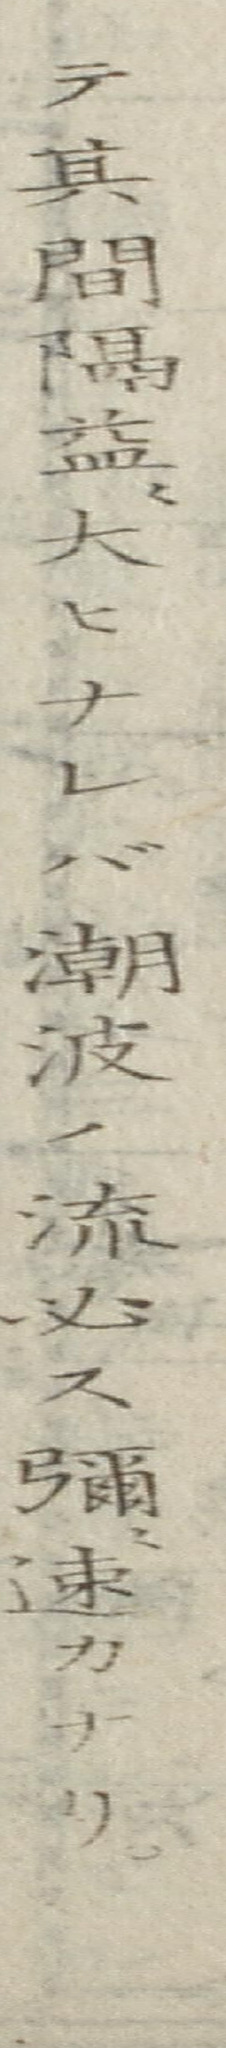テ其間隔益々大ヒナレバ潮波ノ流必ス彌々速カナリ。
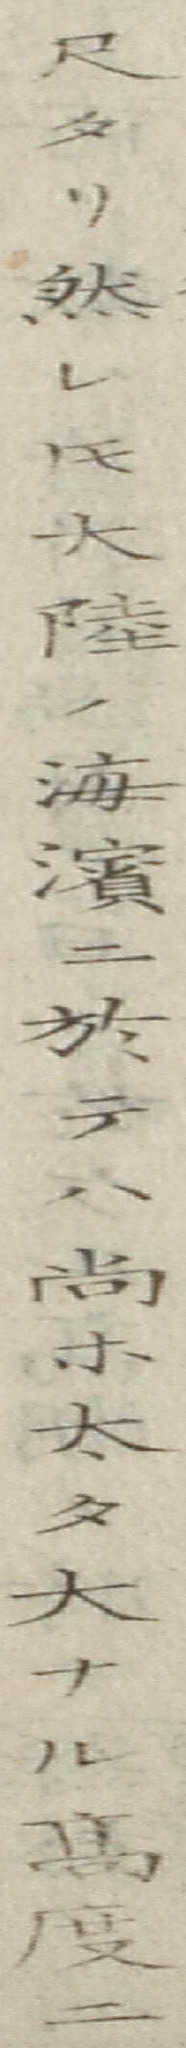尺タリ然レトモ大陸ノ海浜ニ於テハ尚ホ太タ大ナル高度ニ
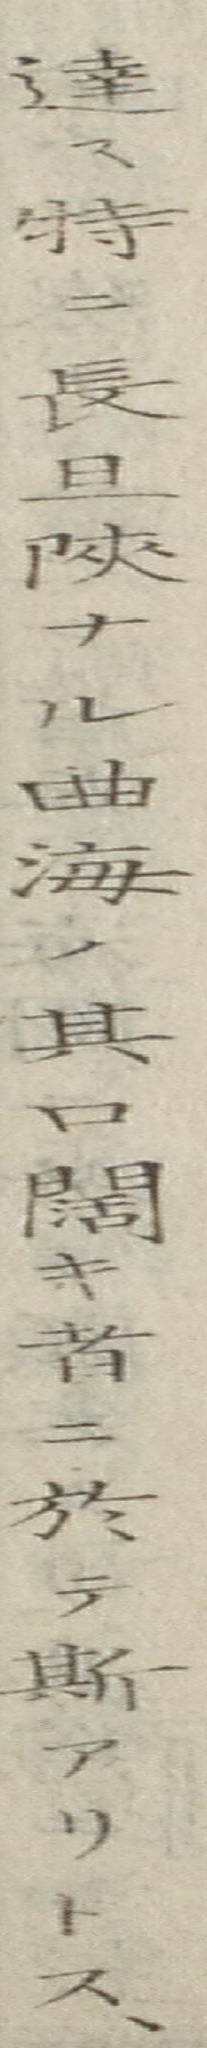達ス特ニ長且狭ナル曲海ノ其口闊キ者ニ於テ斯アリトス、
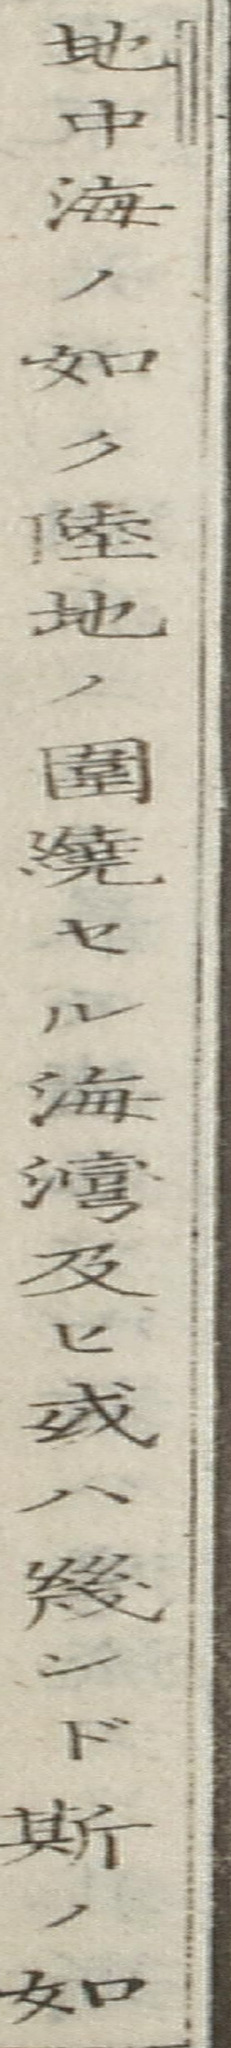地中海ノ如ク陸地ノ囲繞セル海湾及或ハ幾ンド斯ノ如
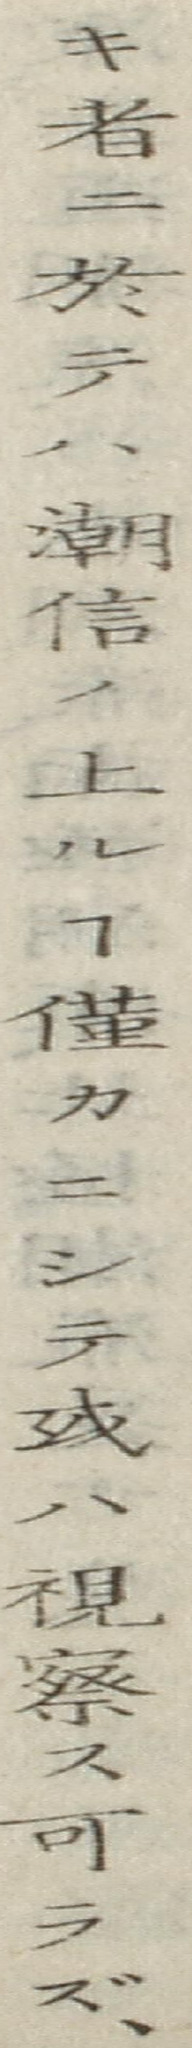キ者ニ於テハ潮信ノ上ルヿ僅カニシテ或ハ視察ス可ラズ、
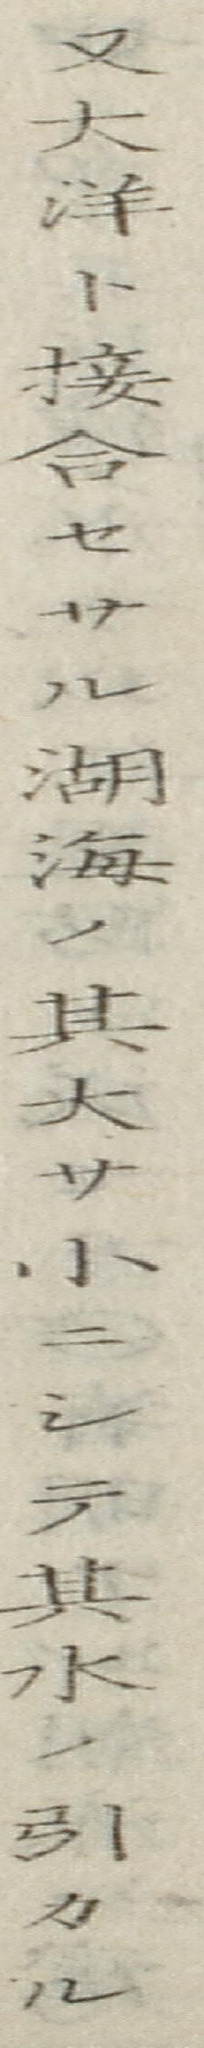又大洋ト接合セサル湖海ノ其大サ小ニシテ其水ノ引カル
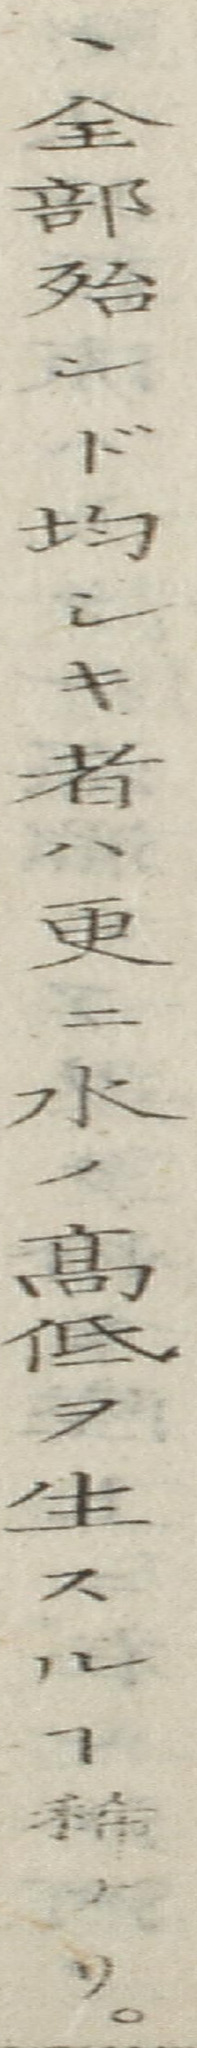ヽ全部殆ンド均シキ者ハ更ニ水ノ高低ヲ生スルヿ稀ナリ。
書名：地形論　巻二
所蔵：東京大学地震研究所図書室 Earthquake Research Institute Library, The University of Tokyo, JAPAN
